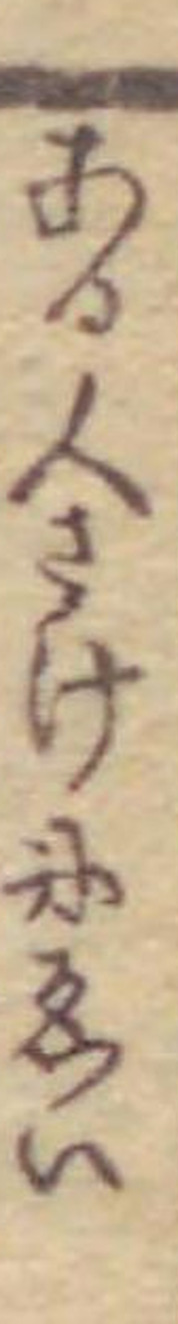ある人さけにゑい
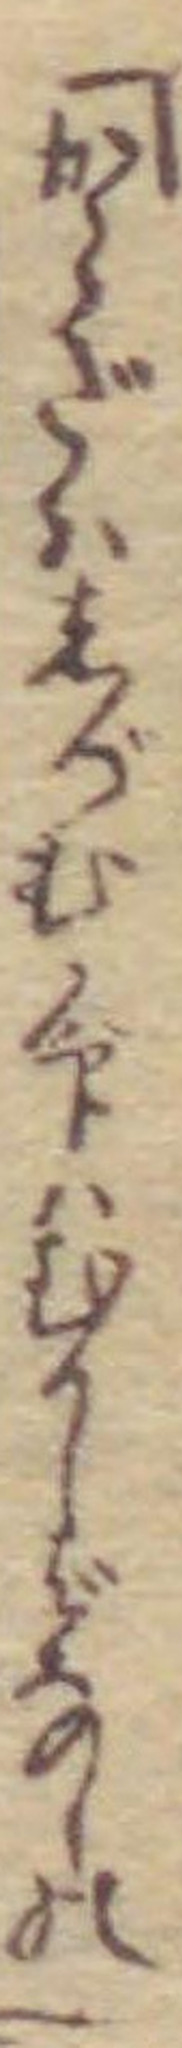〽からだはしづむ命はむかしばなしの
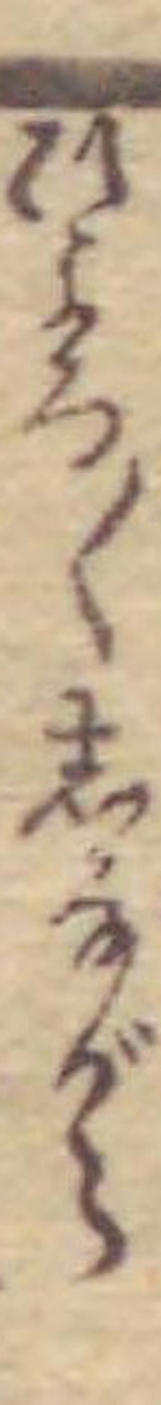ひよろ〳〵しながら
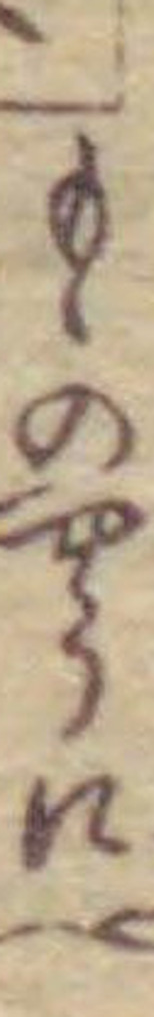もゝのやうに
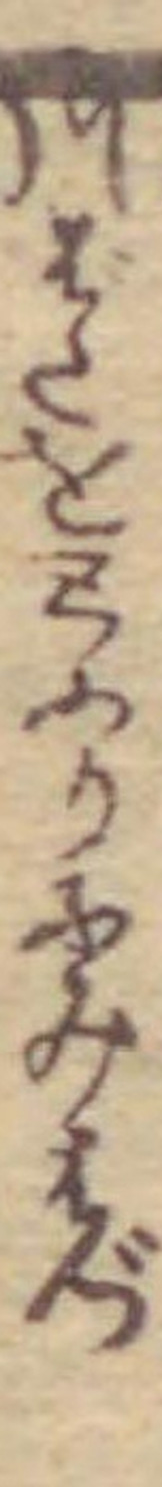川ばたをとふりふみはづ
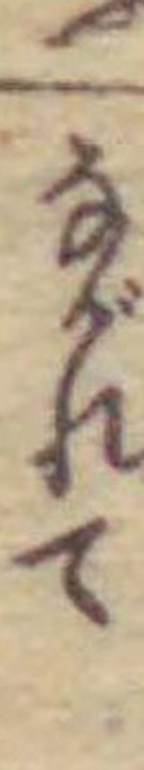ながれて
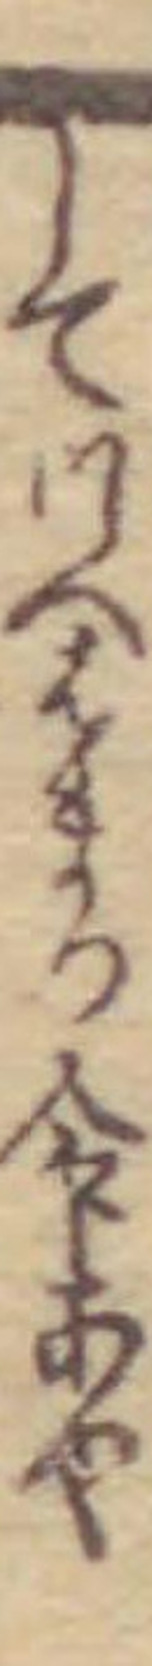して川へはまり命あや
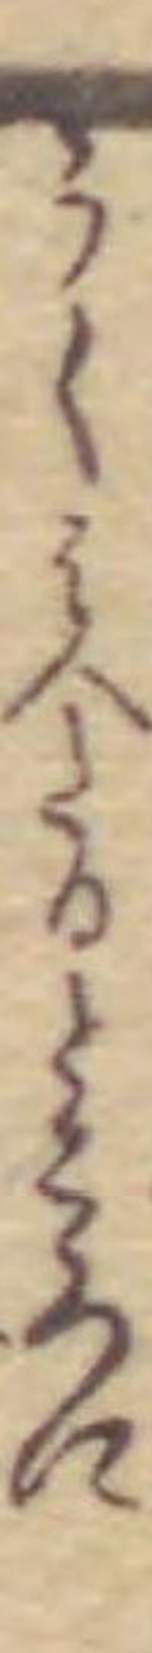うくそへたるところに
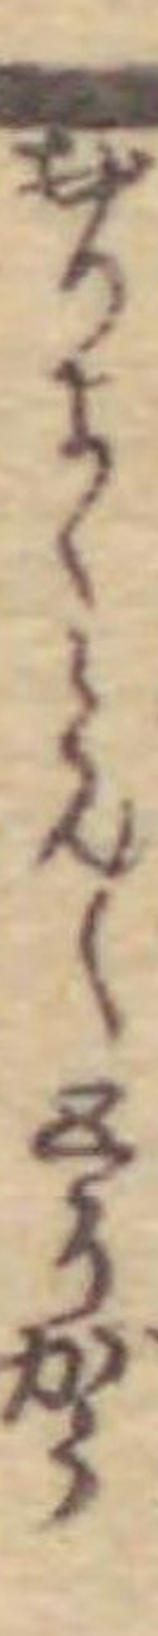おりよくとん〳〵とうがら
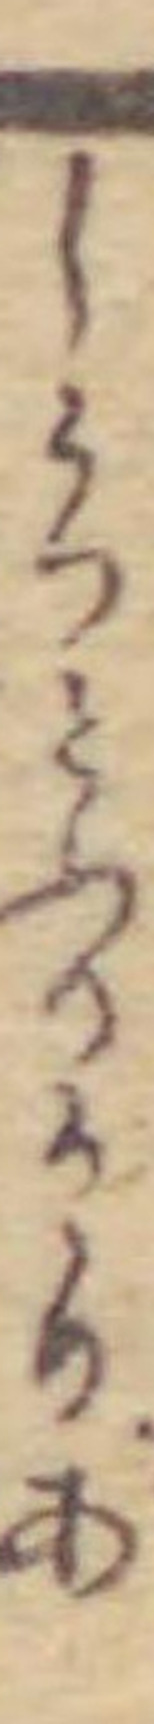しうつとふりかゝりあ
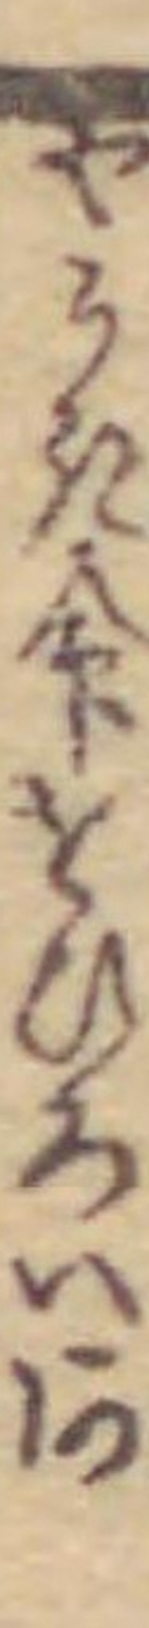やうき命をひろいあ
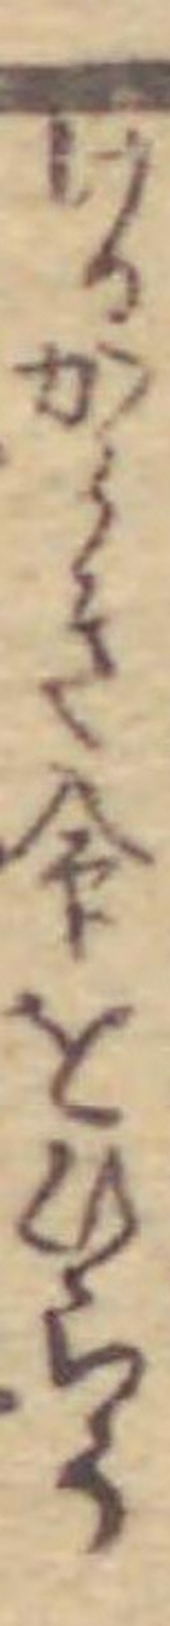けるからき命をひらう
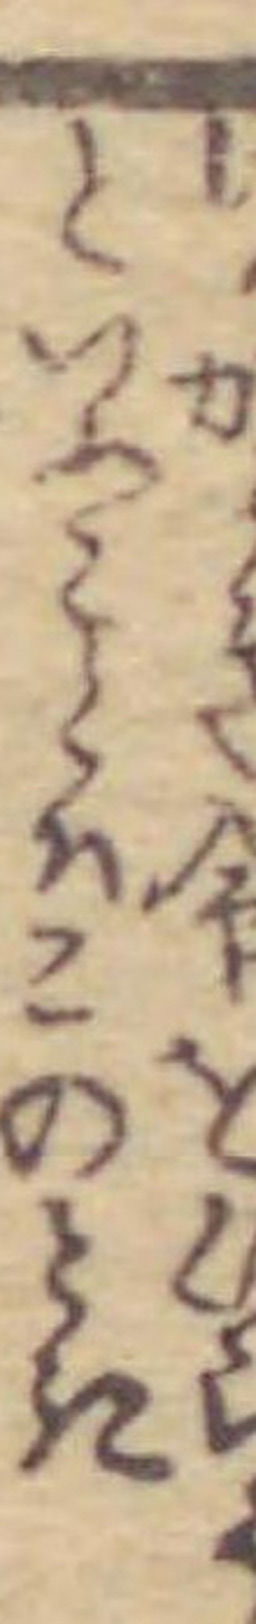といふことはこのとき
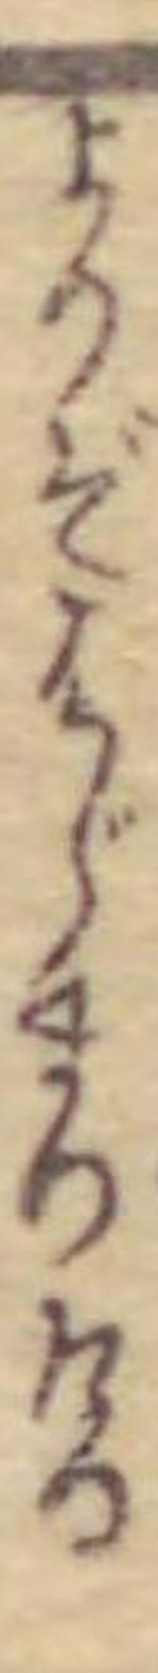よりぞはじまりける
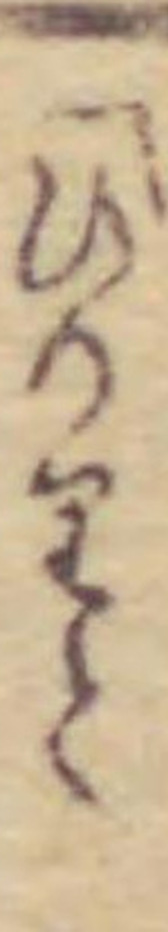〽ひりりと
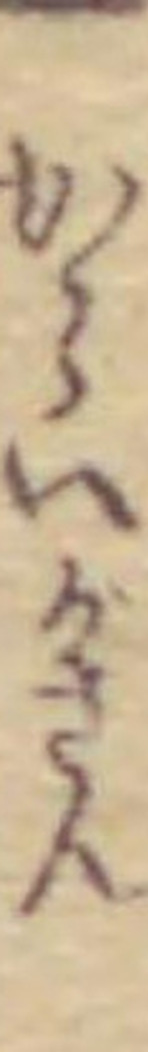からいがさん
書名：御誂染長寿小紋 : 3巻
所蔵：国立国会図書館 National Diet Library, JAPAN
